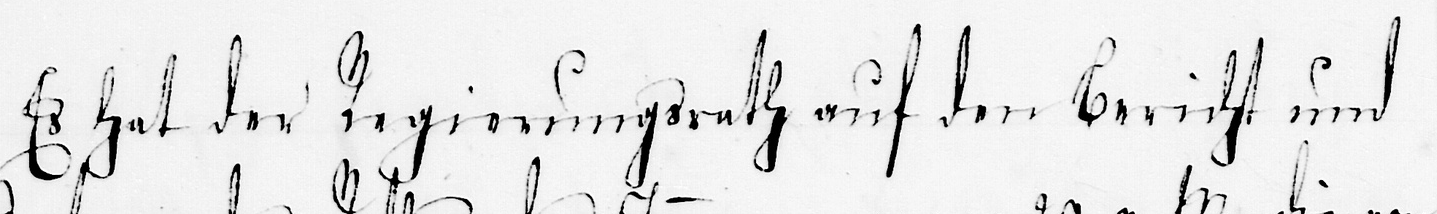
Es hat der Regierungsrath auf den Bericht und
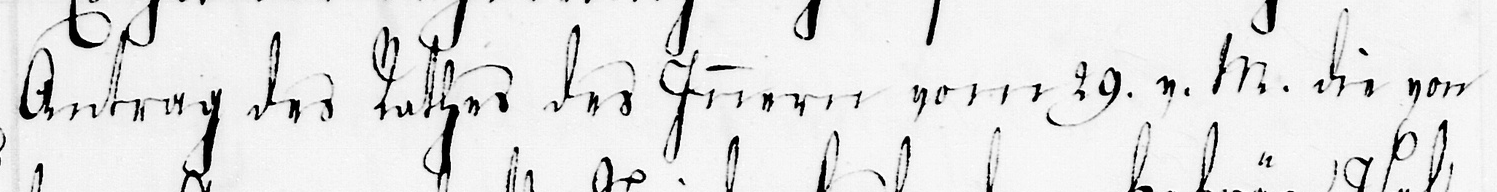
Antrag des Rathes des Innern vom 29. v. M. die von
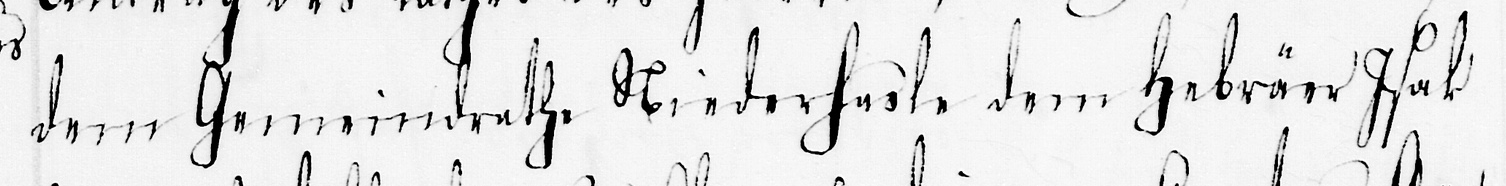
dem Gemeindrathe Niederhasle dem Hebräer Isak
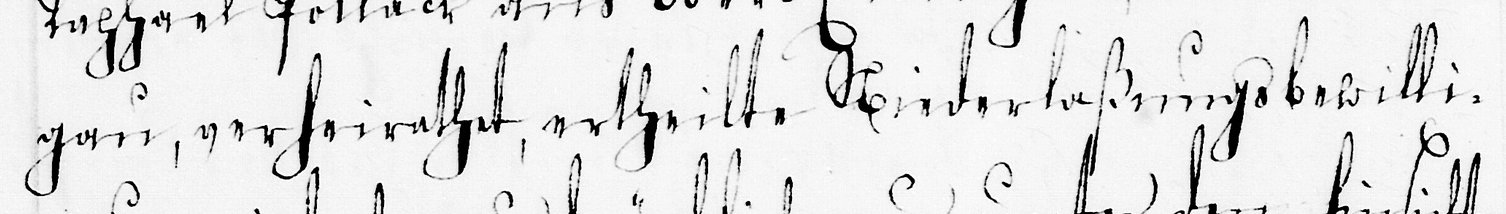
gau, verheirathet, ertheilte Niederlaßungsbewilli¬
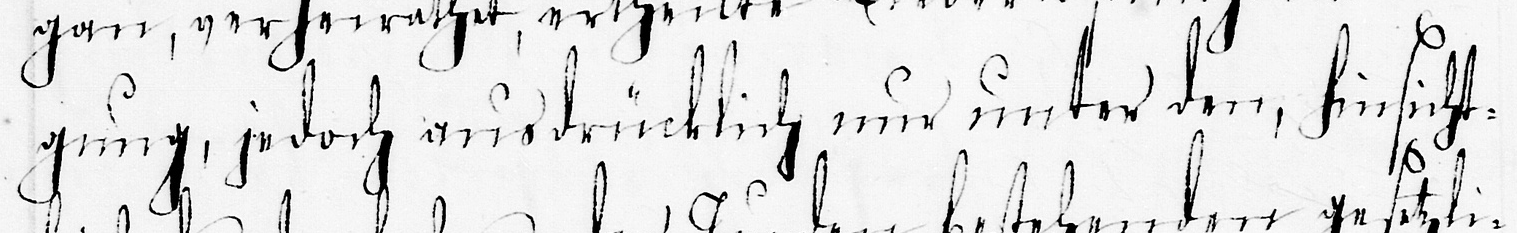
gung, jedoch ausdrücklich nur unter den, hinsicht¬
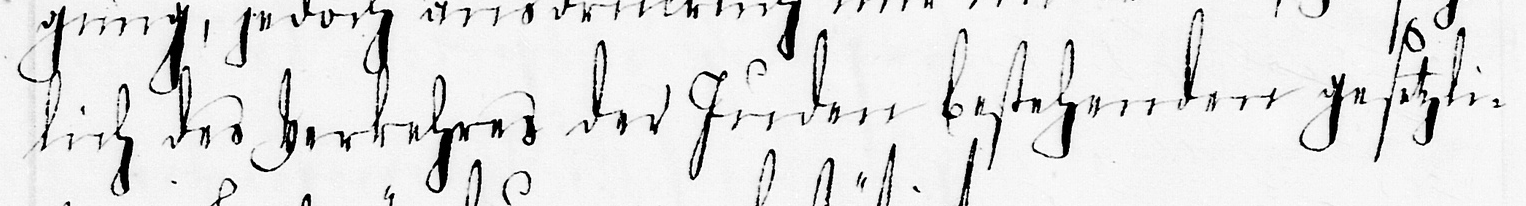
lich des Verkehres der Juden bestehenden gesetzli¬
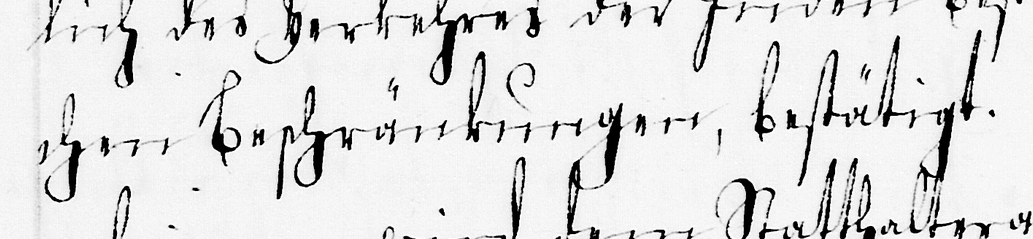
chen Beschränkungen, bestätigt.
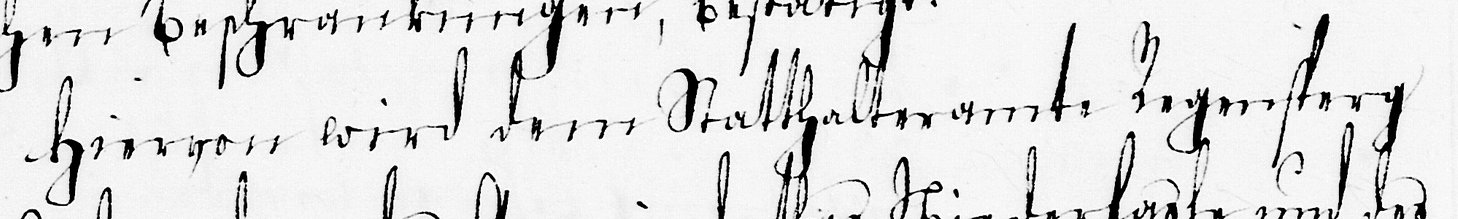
Hiervon wird dem Statthalteramte Regensperg
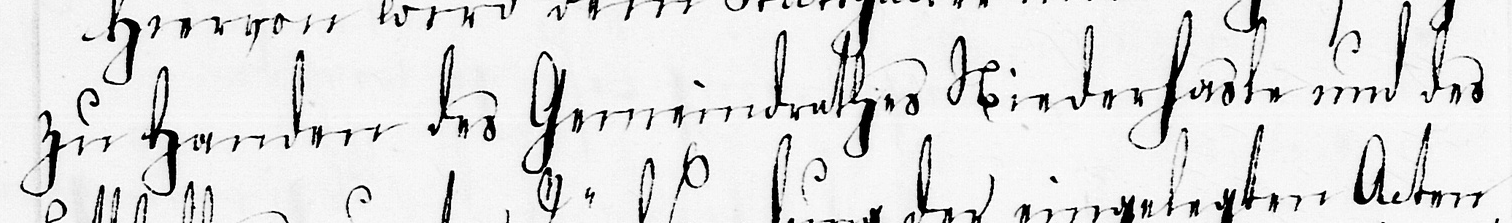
zu Handen des Gemeindrathes Niederhasle und des
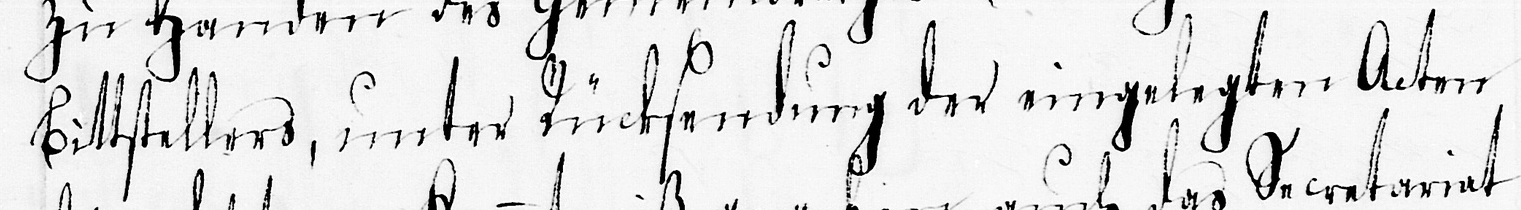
Bittstellers, unter Rücksendung der eingelegten Acten
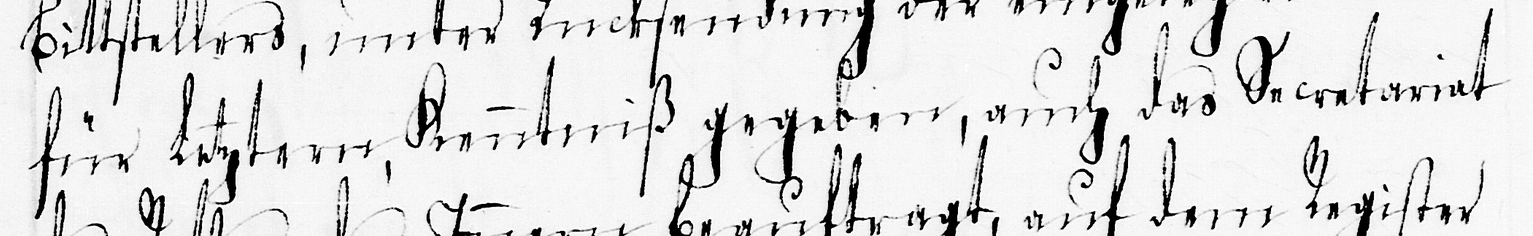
für Letztern, Kenntniß gegeben, auch das Secretariat
